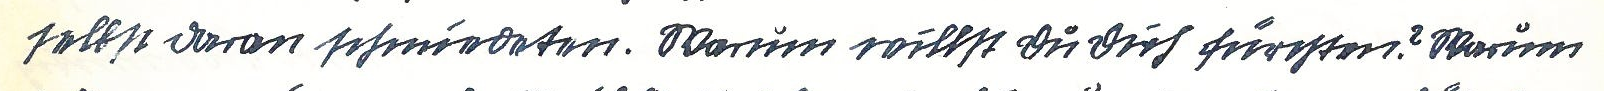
selbst daran schmiedeten. Warum willst Du Dich fürchten? Warum
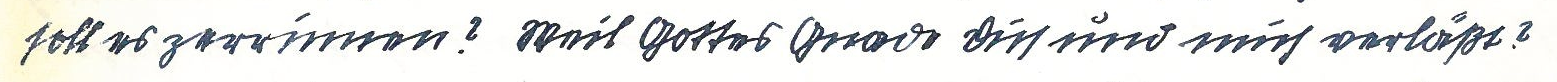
soll es zerrinnen? Weil Gottes Gnade Dich und mich verläßt?
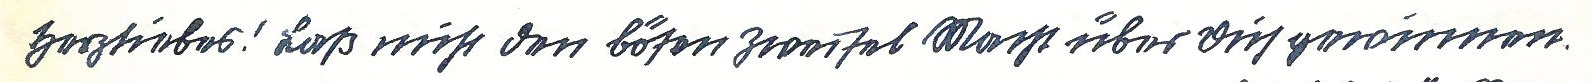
Herzliebes! Laß nicht den bösen Zweifel Macht über Dich gewinnen.
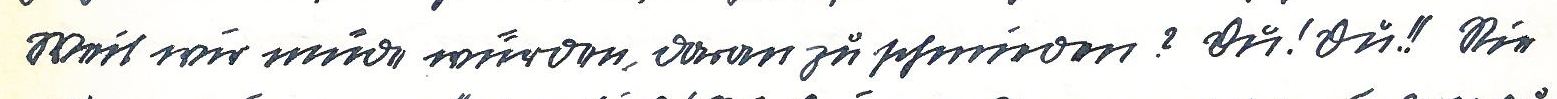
Weil wir müde wurden, daran zu schmieden? Du! Du!! Nie
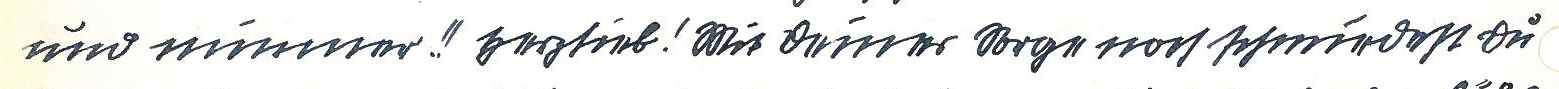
und nimmer!! Herzlieb! Mit Deiner Sorge noch schmiedest Du
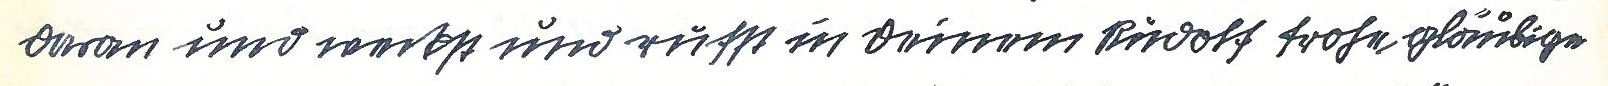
daran und weckst und rufst in Deinem frohe, gläubige
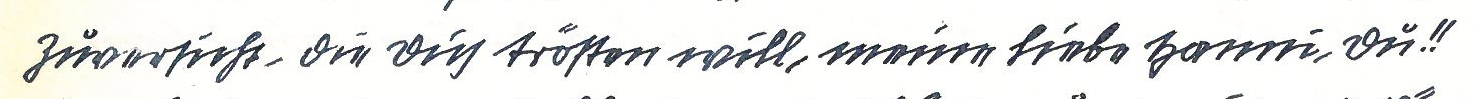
Zuversicht, die Dich trösten will, meine liebe, Du!!
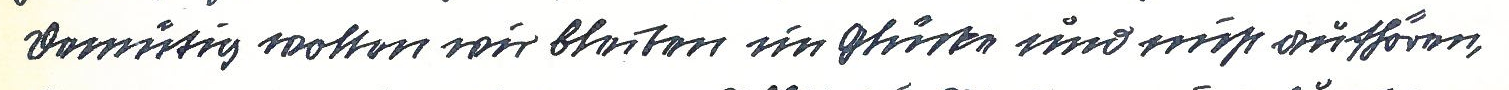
Demütig wollen wir bleiben im Glücke und nicht aufhören,
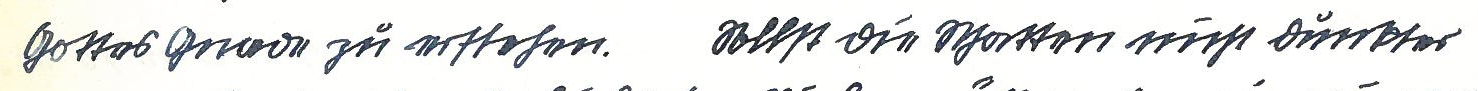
Gottes Gnade zu erstehen. Sollst die Schatten nicht dunkler
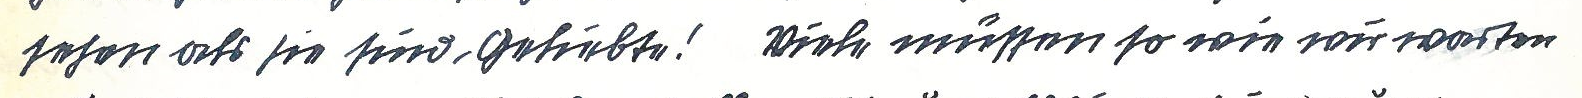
sehen als sie sind, Geliebte! Viele müssen so wie wir warten
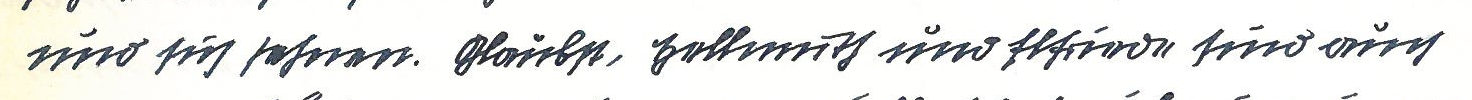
und sich sehnen. Glaubst, H. und E. sind auch
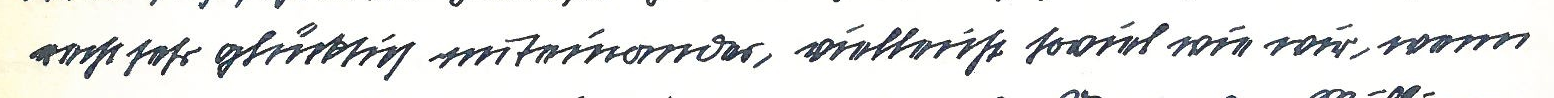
recht sehr glücklich miteinander, vielleicht soviel wie wir, wenn
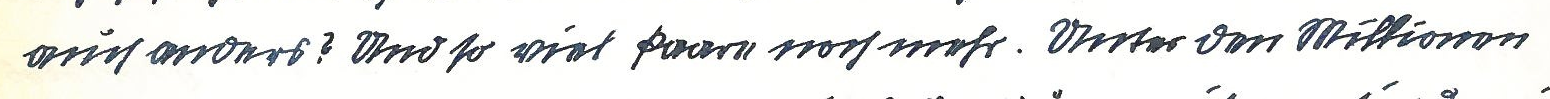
auch anders? Und so viel Paare noch mehr. Unter den Millionen
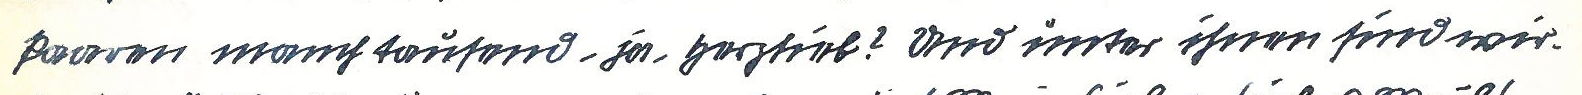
Paaren manch tausend, ja, Herzlieb? Und unter ihnen sind wir.
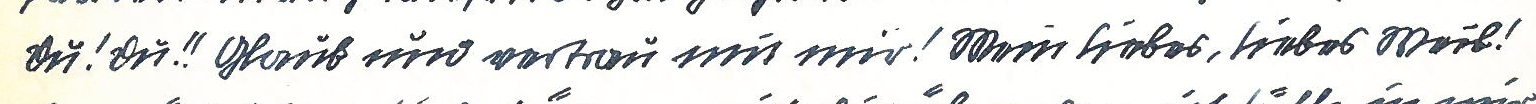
Du! Du!! Glaub und vertrau mit mir! Mein liebes, liebes Weib!
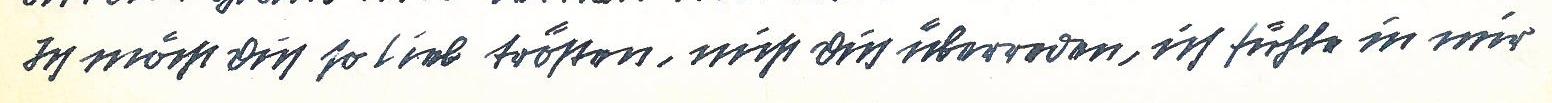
Ich möcht dich so lieb trösten, nicht Dich überreden, ich fühle in mir
